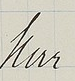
Freund
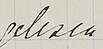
gelesen;
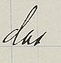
kann
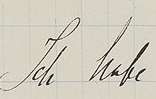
aber nur
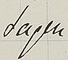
sagen
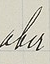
der
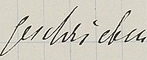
geschrieben
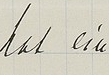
sein muss.
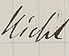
selbst
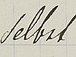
Namen
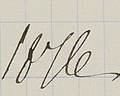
24.
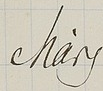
März
